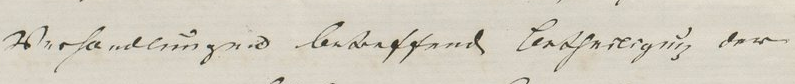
Verhandlungen betreffend Betheiligung der
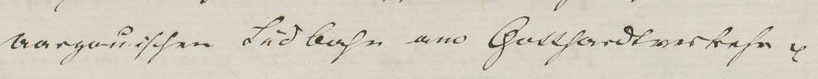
aargauischen Südbahn am Gotthardtverkehr &
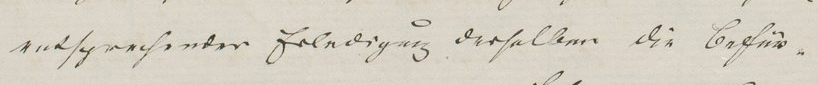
entsprechender Erledigung derselben die Befür-
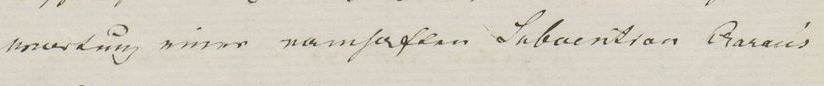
wortung einer namhaften Subvention Aarau's
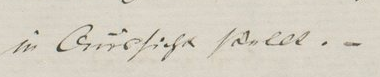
in Aussicht stellt. –
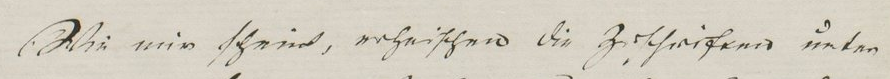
Wie mir scheint, erheischen die Zuschriften unter
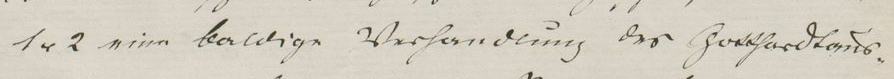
1 & 2 eine baldige Verhandlung des Gotthardtaus-
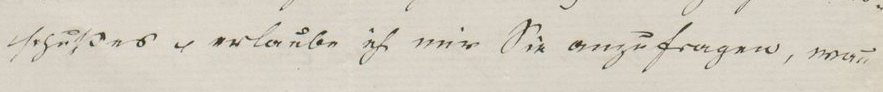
schußes & erlauben mir Sie anzufragen, wann
